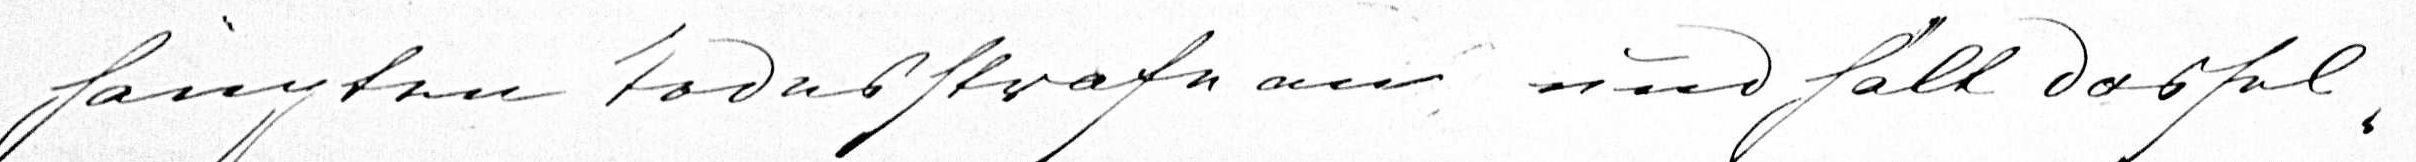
hangten Todesstrafe an und halt dassel¬
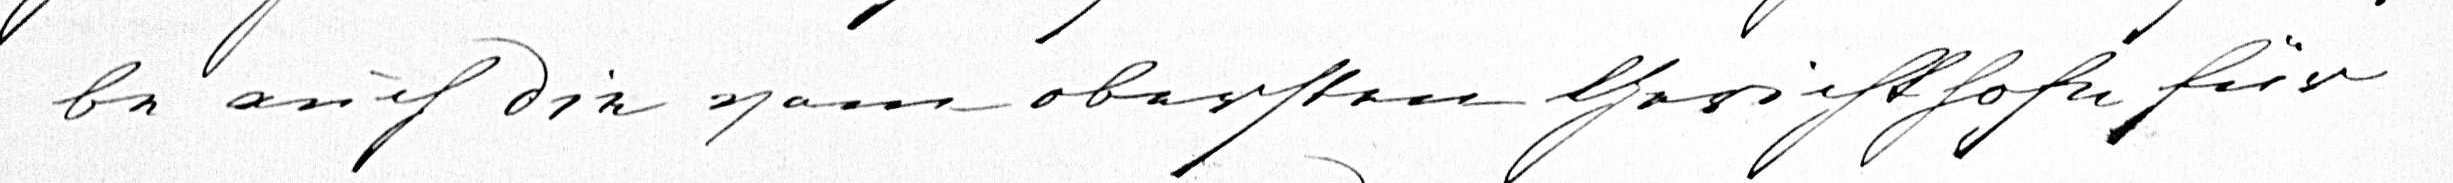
be auch die vom obersten Gerichthofe für
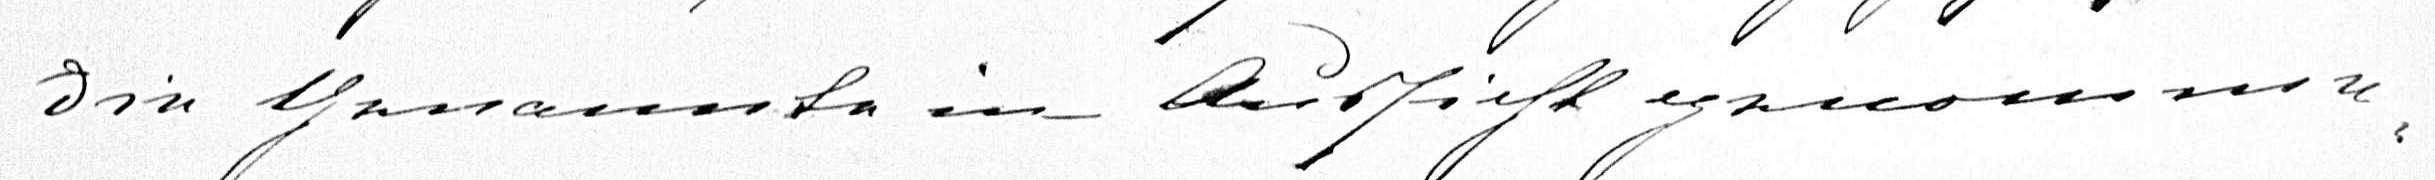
die Genannte in Aussicht genomme¬
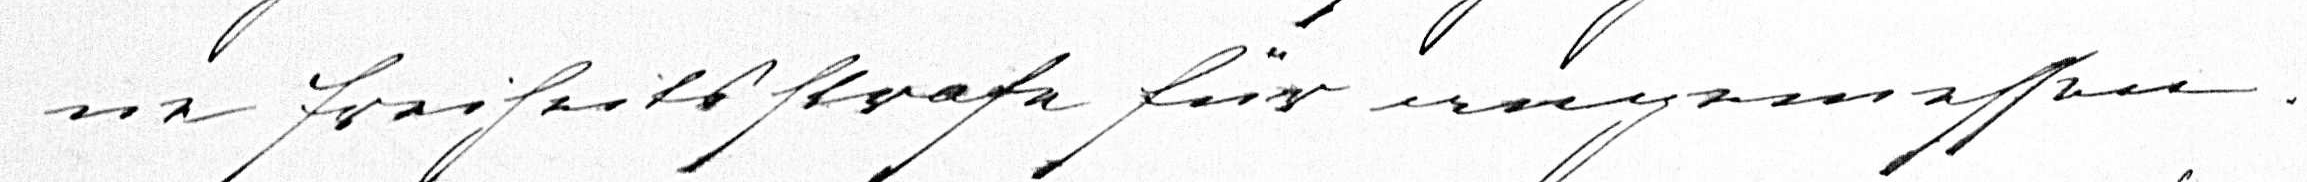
ne Freiheitsstrafe für angemessen.
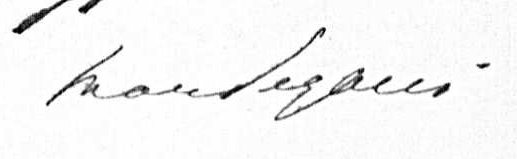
Kondgani
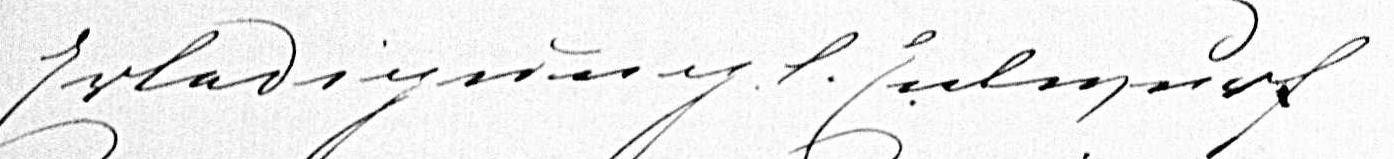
Erladigung 1. Entwurf
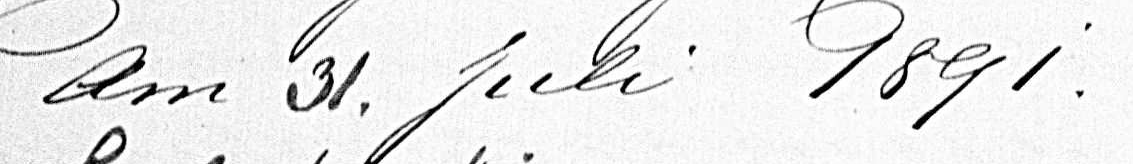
Am 31. Juli 1891.
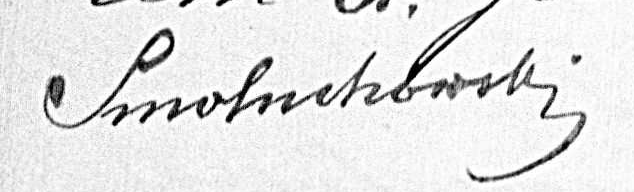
Smolxx
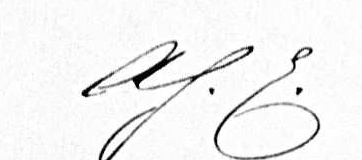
Ah. E.
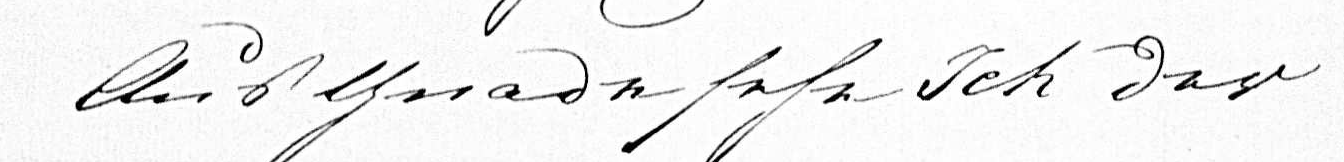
Aus Gnade sehe ich der
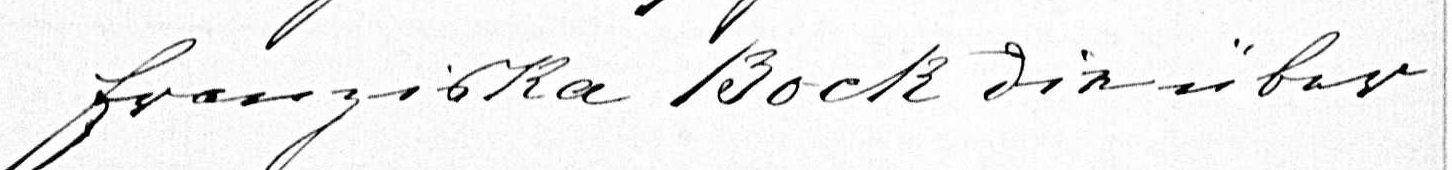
Franziska Bock die über
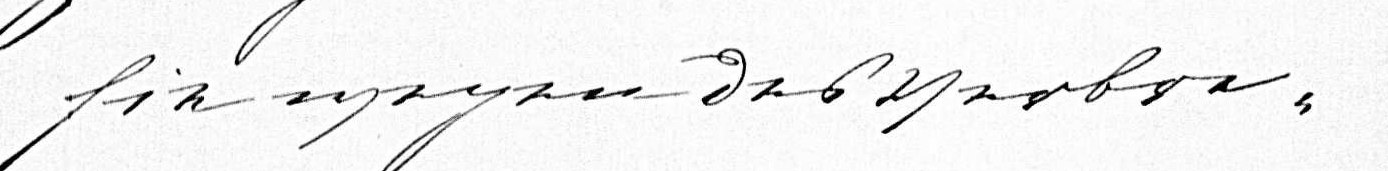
sie wegen das Verbre¬
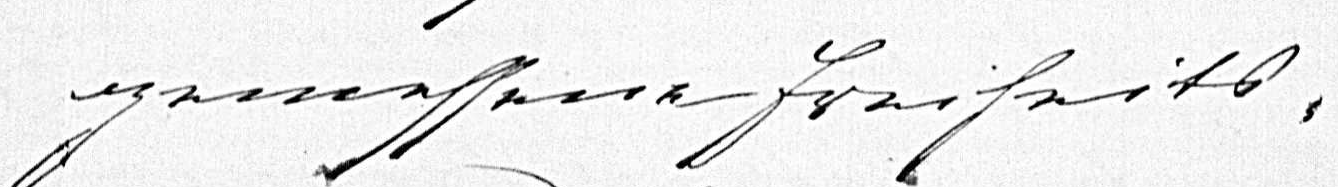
gemessene Freiseits,
